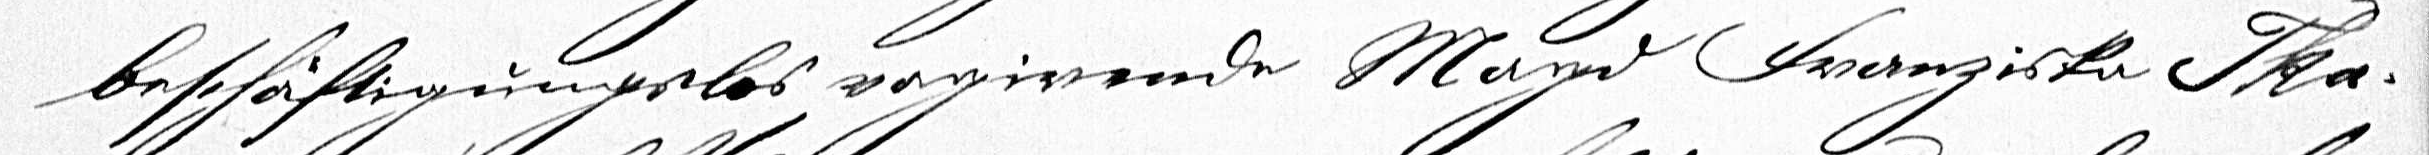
beschäftigungslos regirende Magd Franziska Tka¬
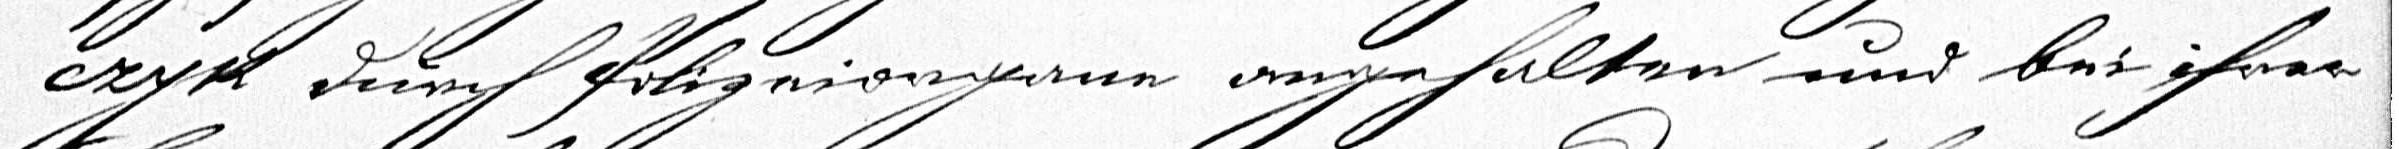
czyk durch Polizeiorgane angehalten und bei ihrer
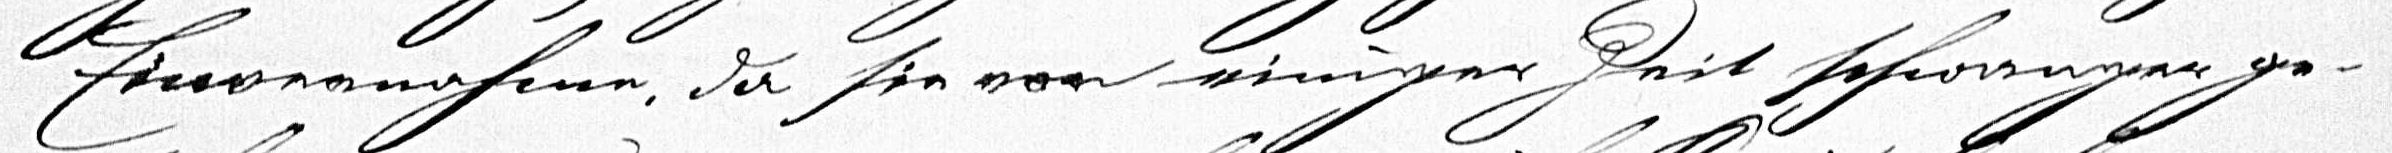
Einvernahme, da sie vor einiger Zeit schwanger ge¬
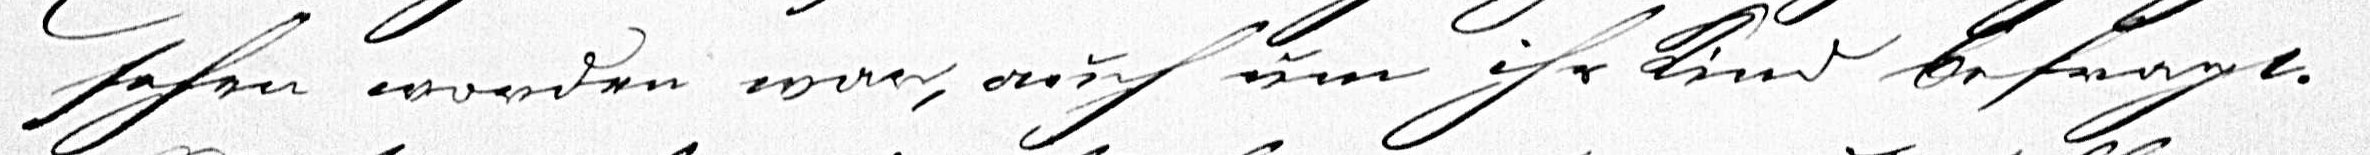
sehen worden war, auch um ihr Kind befragt.
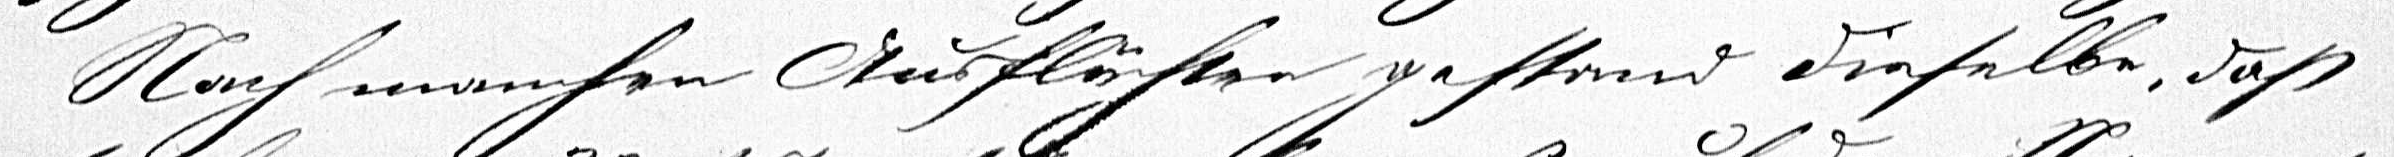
Nach manchen Ausflüchten gestand dieselbe, daß
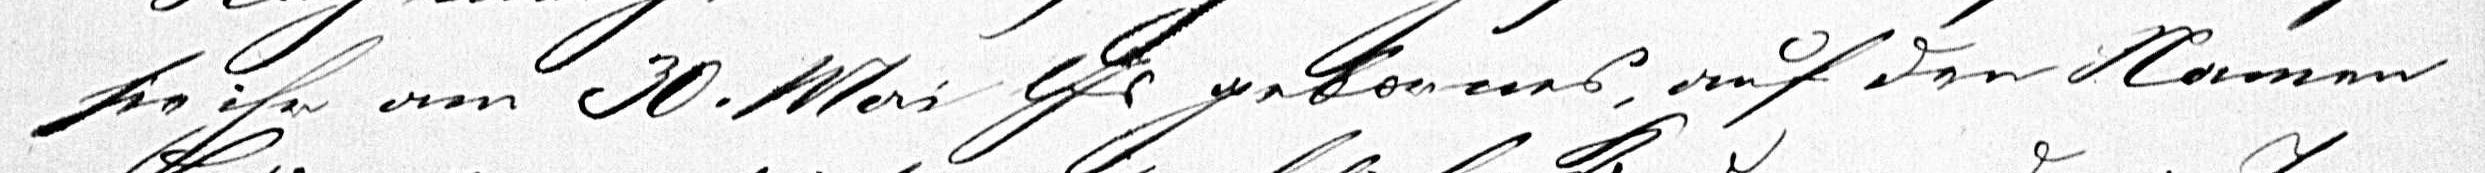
sie ihr am 30. Mai lJs gebornes, auf den Namen
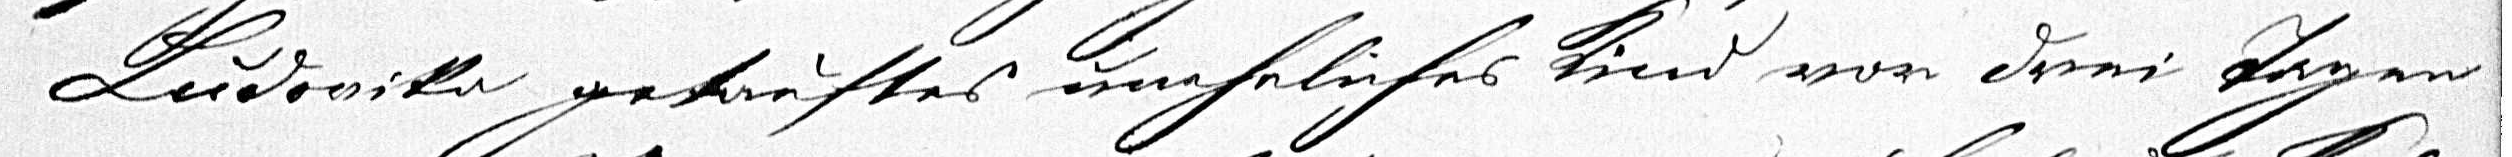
Ludovika getauftes uneheliches Kind vor drei Tagen
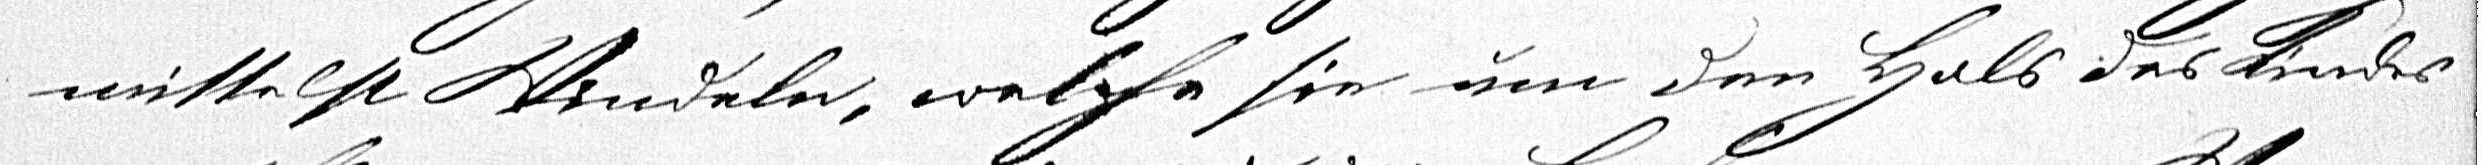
mittelst Windeln, welche sie um den Hals des Kindes
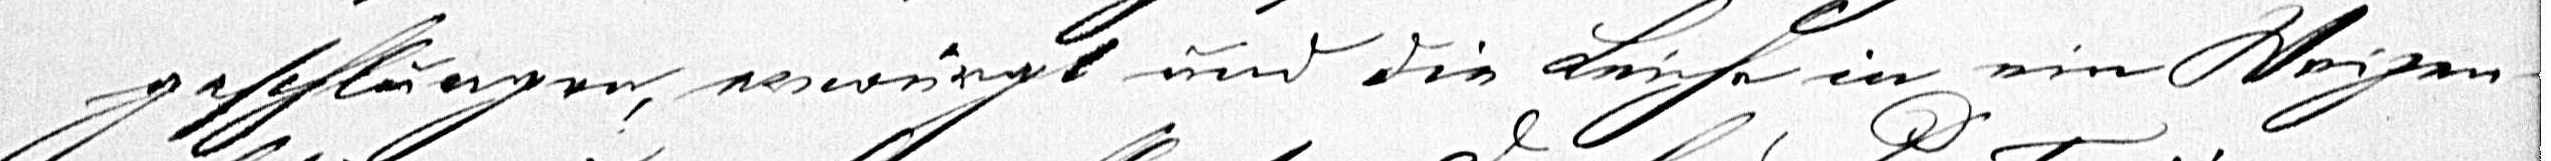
geschlungen, erwürgt und die Leiche in ein Weizen¬
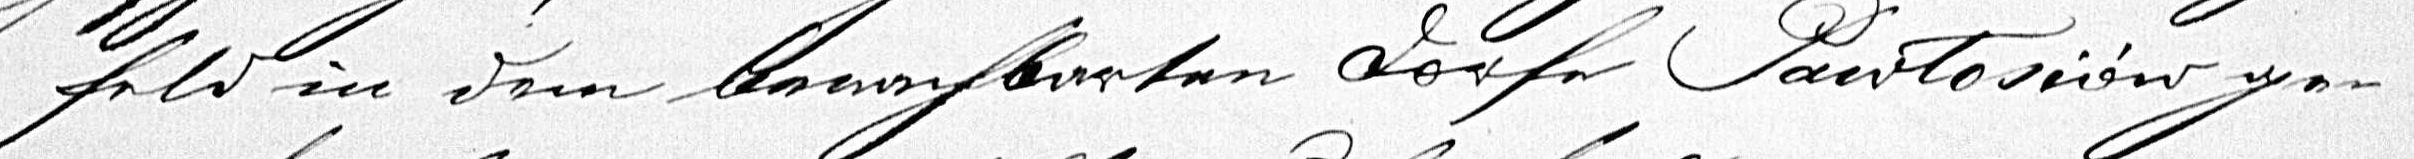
feld in dem benachbarten Dorfe Pawtosiów ge¬
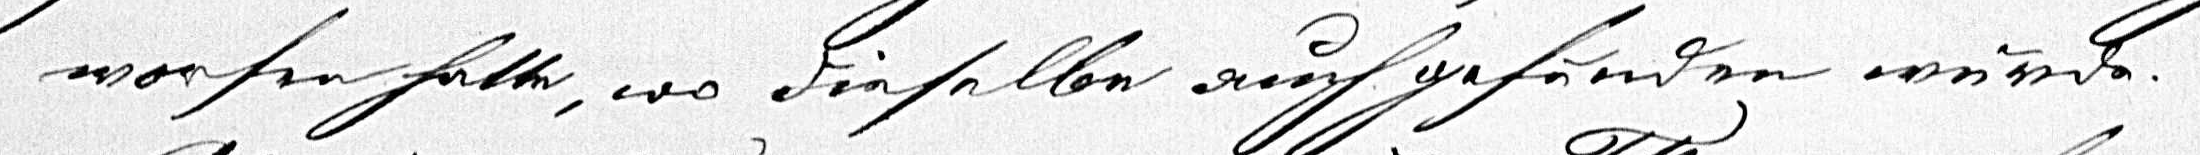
worfen hatte, wo dieselbe auch gefunden wurde.
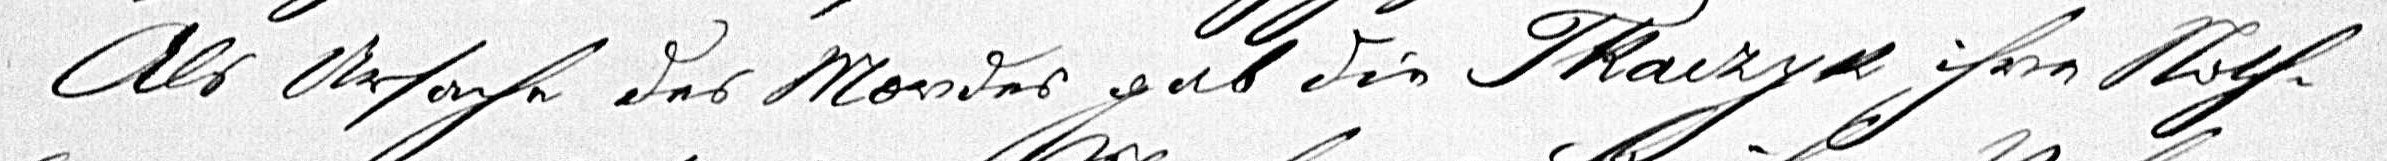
Als Ursache des Mordes gab die Tkaczyk ihre Noth¬
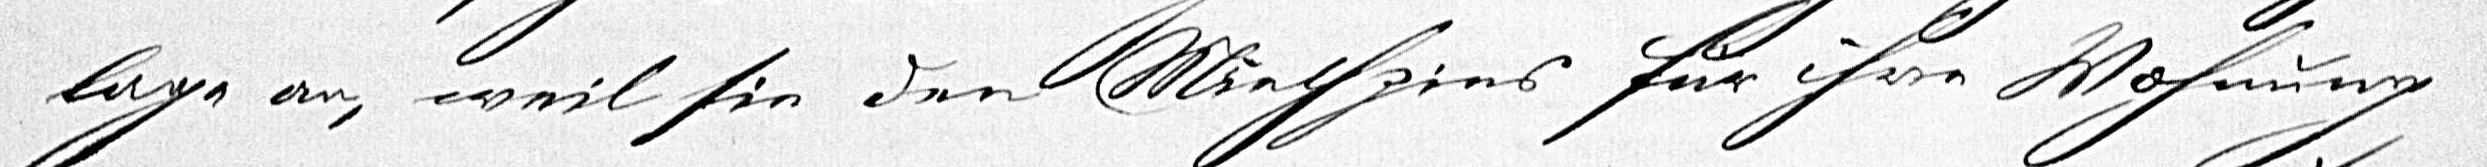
lage an, weil sie den Miethzins für ihre Wohnung
